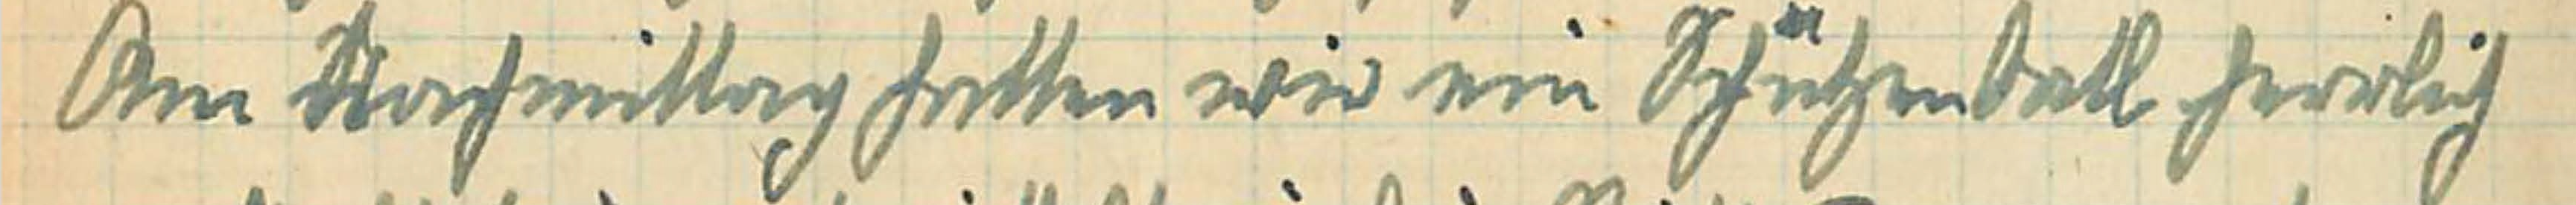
Am Nachmittag hatten wir ein Schützenbatl. herrlich
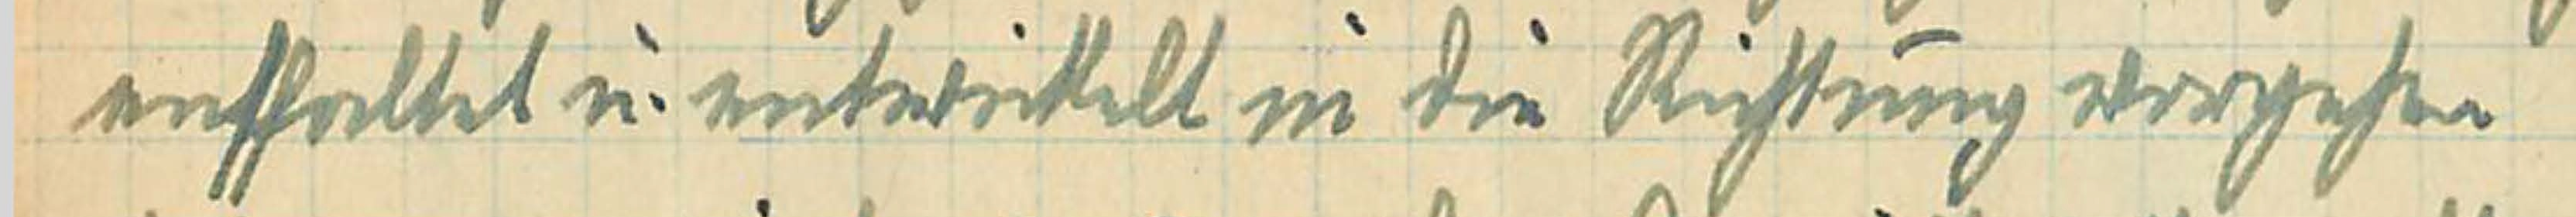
entfaltet u. entwickelt in die Richtung vorgehen
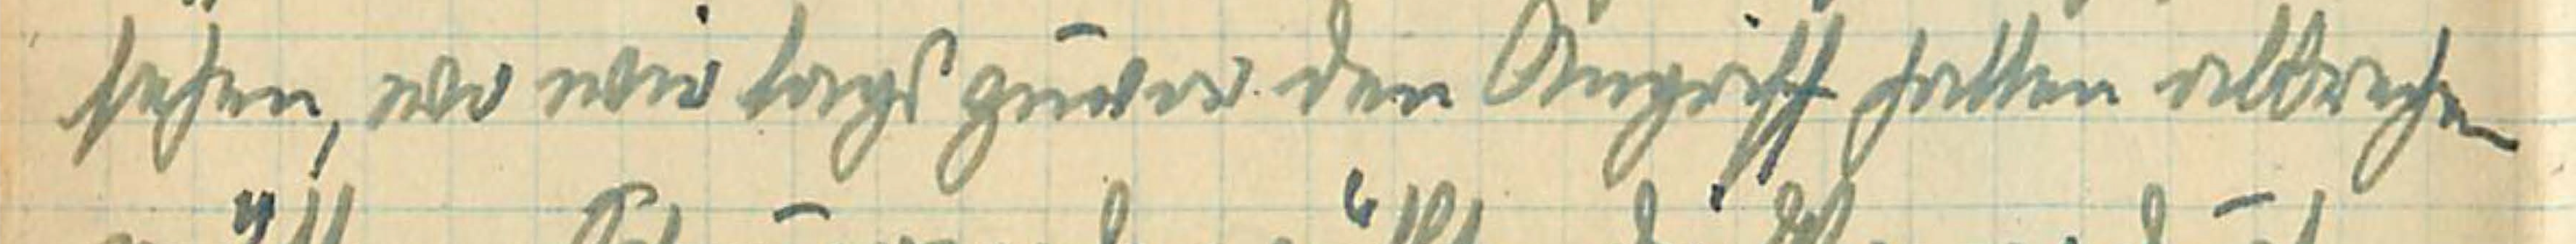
sehen, wo wir tags zuvor den Angriff hatten abbrechen
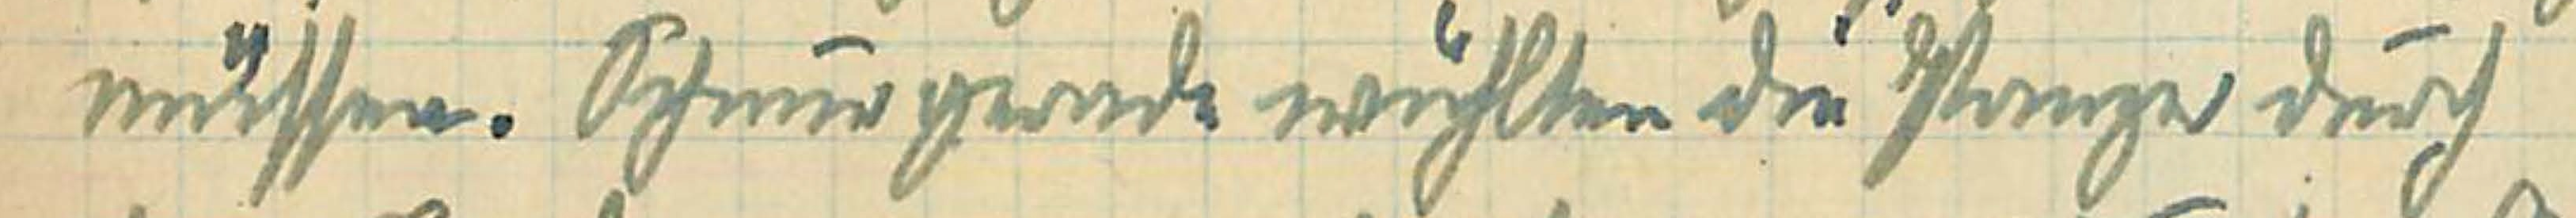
müssen. Schnurgerade wühlten die Panzer durch
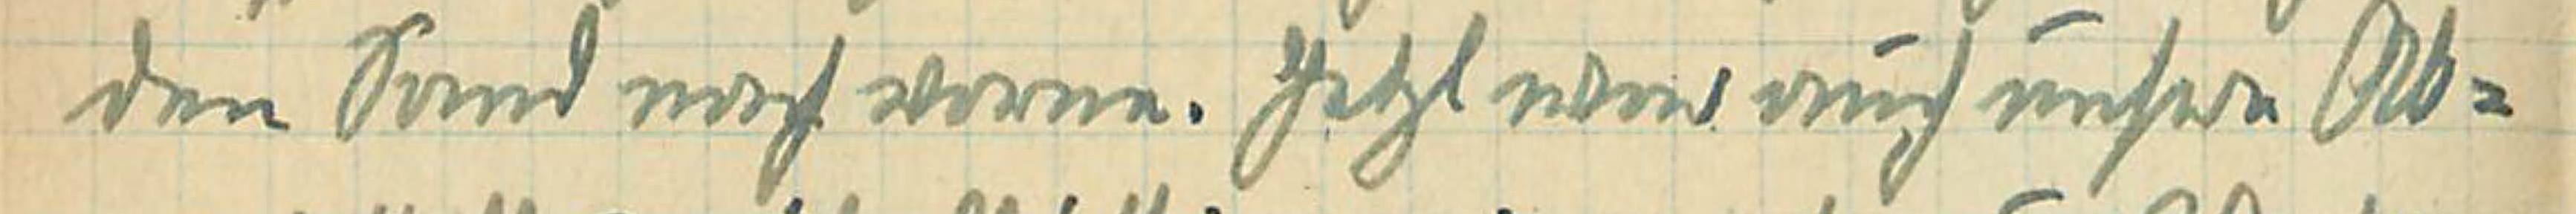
den Sand nach vorne. Jetzt war auch unsere Ab-
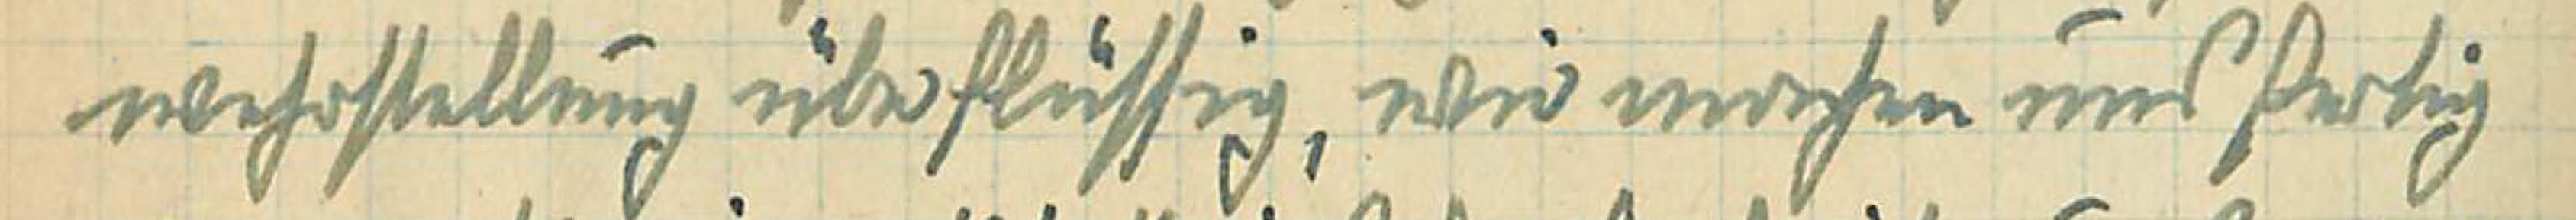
wehrstellung überflüssig, wir machen uns fertig
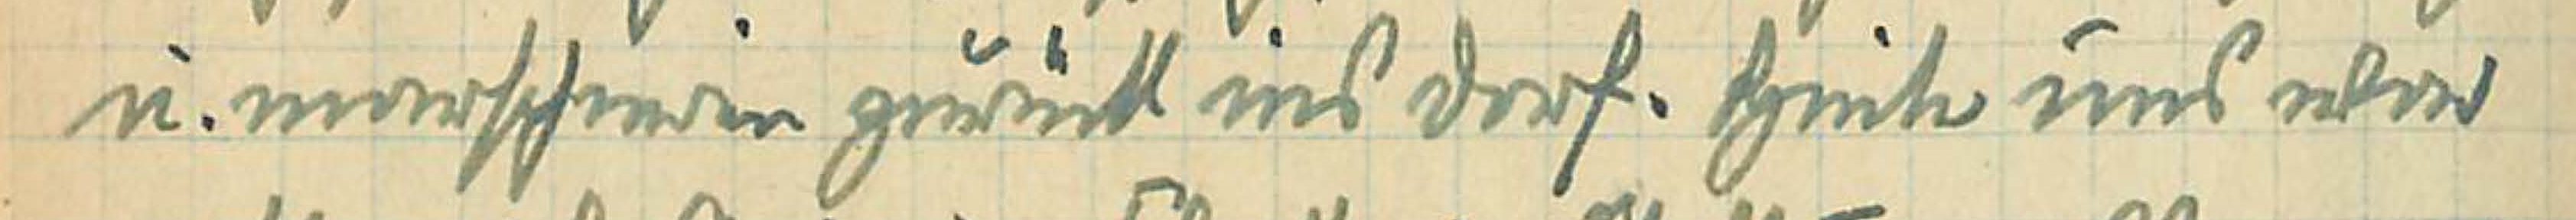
u. marschieren zurück ins Dorf. Hinter uns war
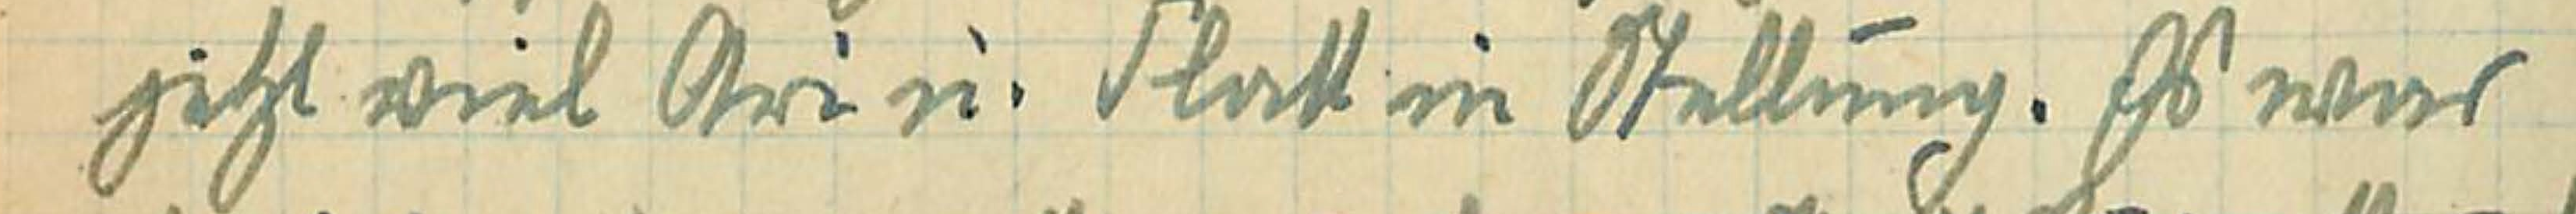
jetzt viel Ari. u. Flak in Stellung. Es war
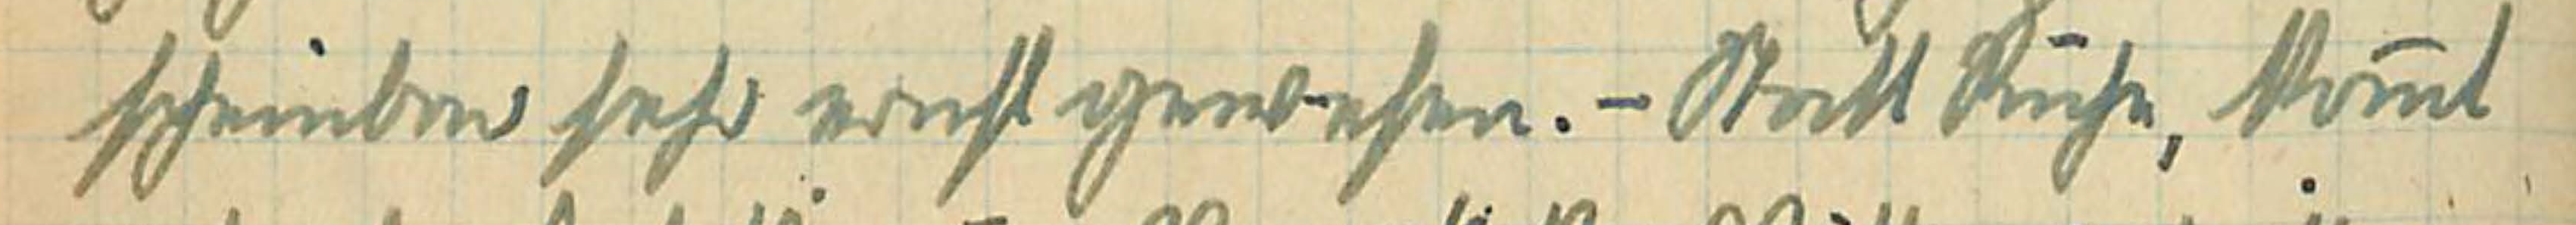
scheinbar sehr ernst gewesen. – Statt Ruhe, kommt
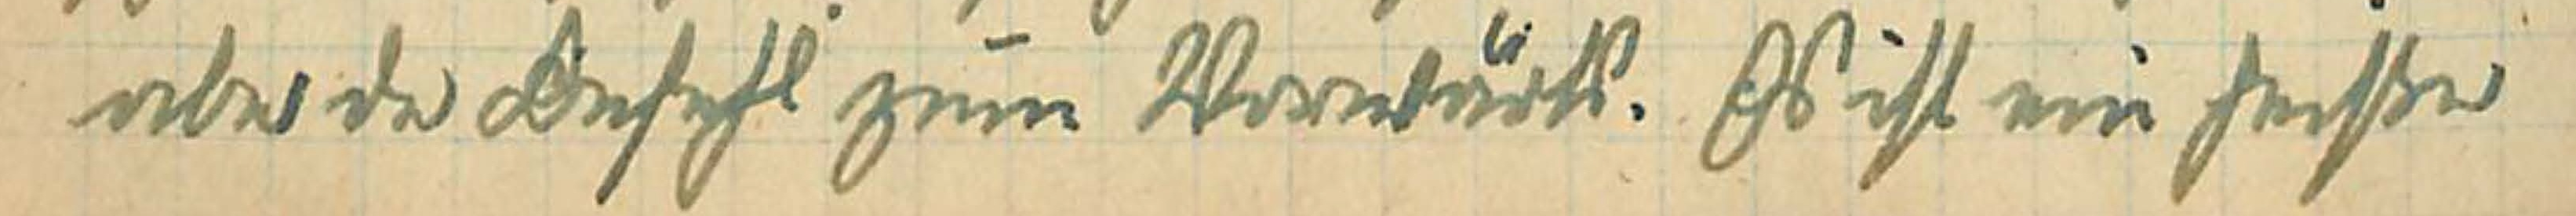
aber der Befehl zum Vorwärts. Es ist ein heißer
